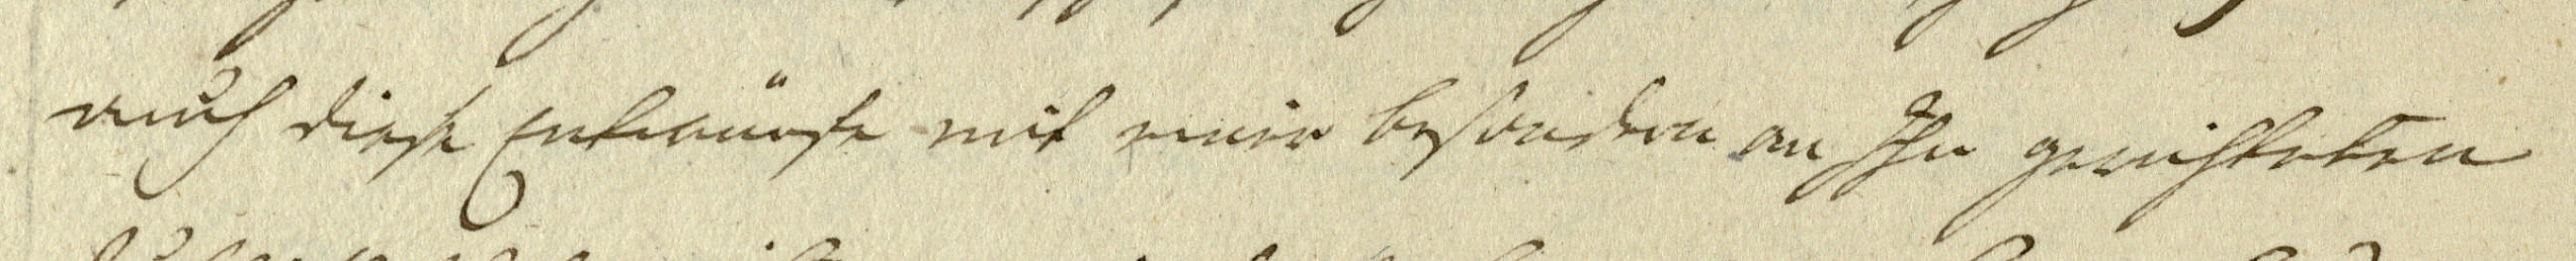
auch diese Entwürfe mit einer besondern an Ihn gerichteten
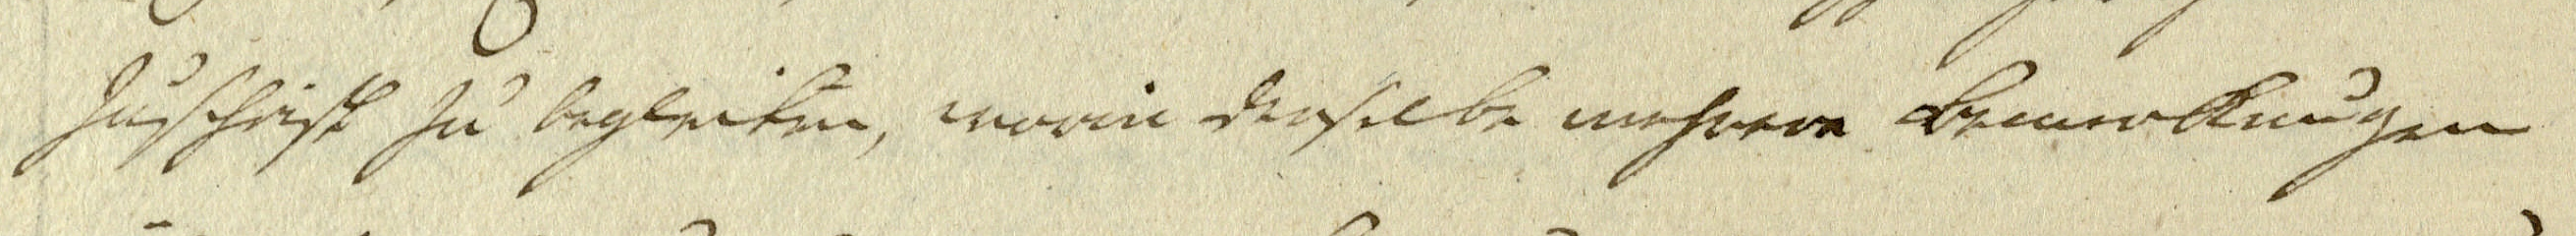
Zuschrift zu begleiten, worin derselbe mehrere Bemerkungen
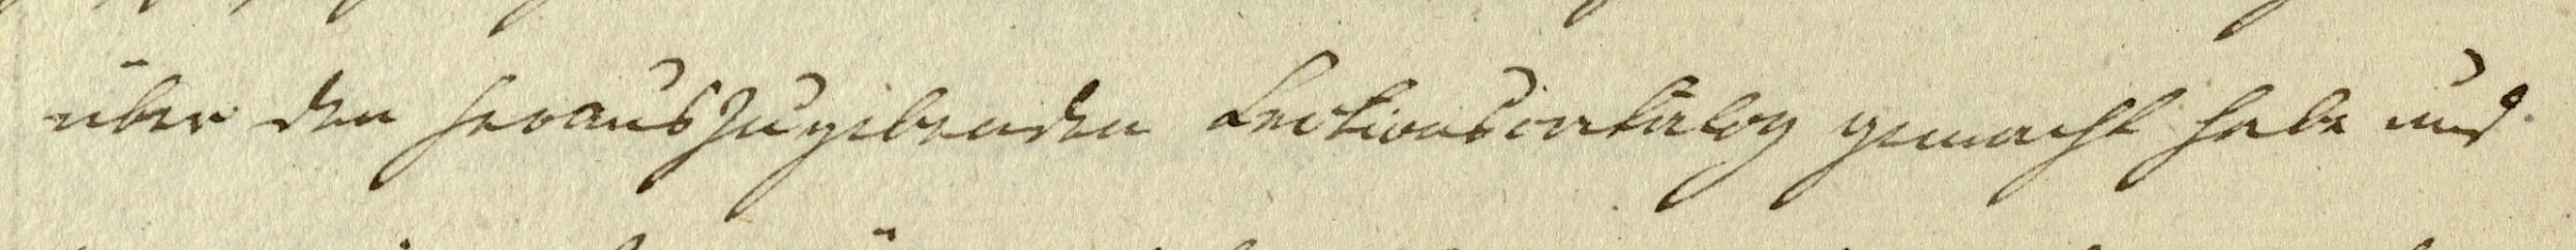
über den herauszugebenden Lectionscatalog gemacht habe und
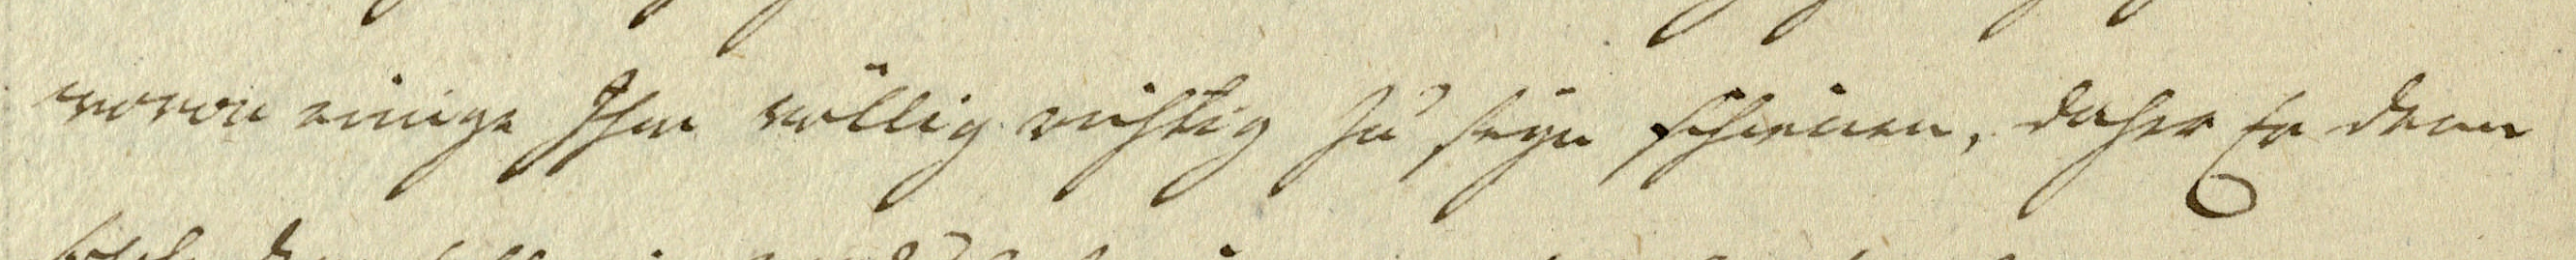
wovon einige Ihm völlig richtig zu seÿn scheinen, daher Er denn
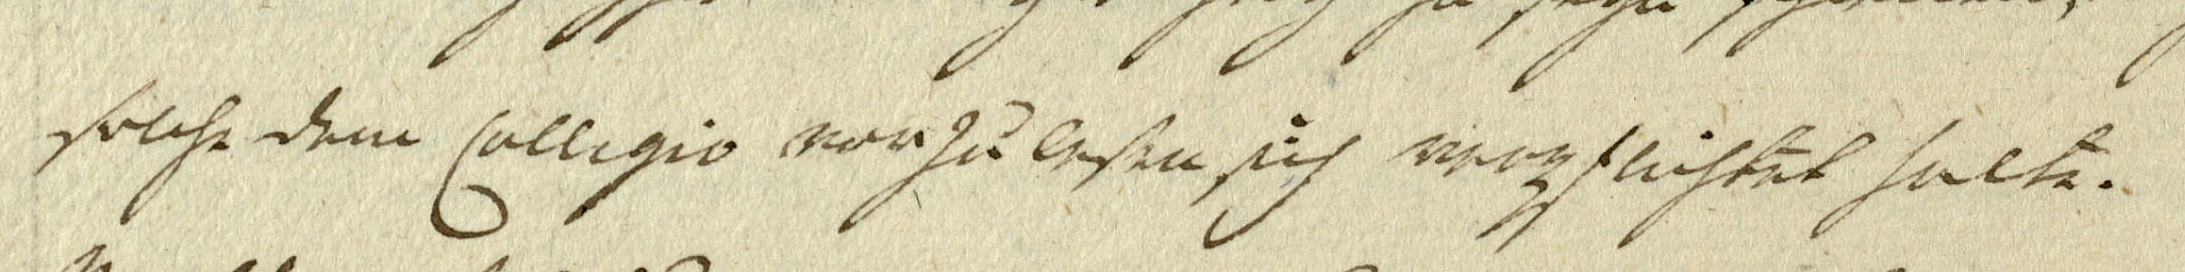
solche dem Collegio vorzulesen sich verpflichtet halte.
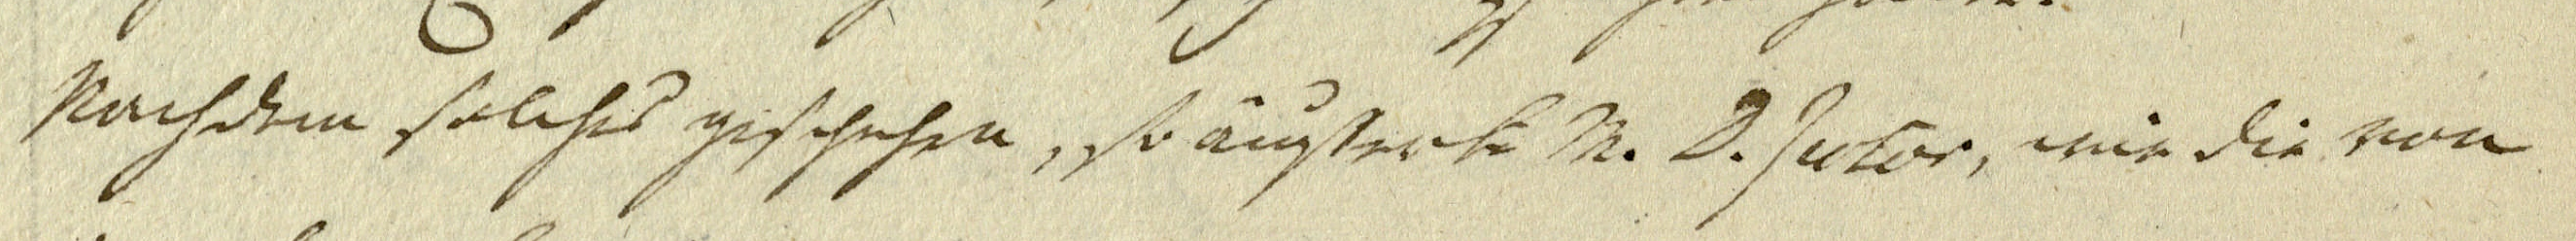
Nachdem solches geschehen, so äusserte M. D. Rector, wie die von
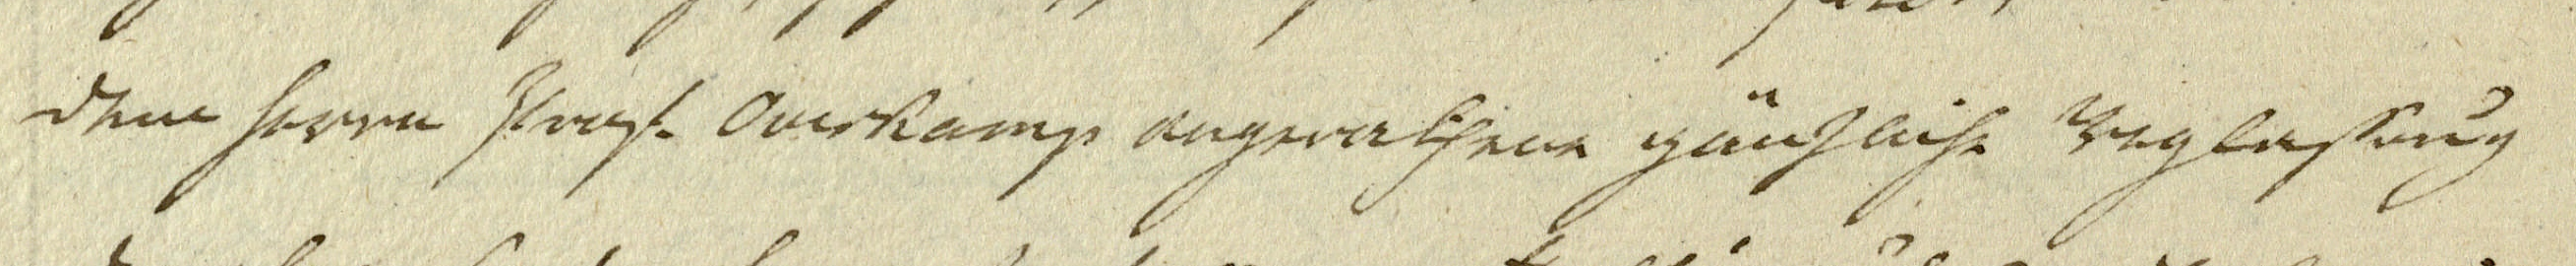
dem Herrn Prof. Overkamp angerathene gänzliche Weglassung
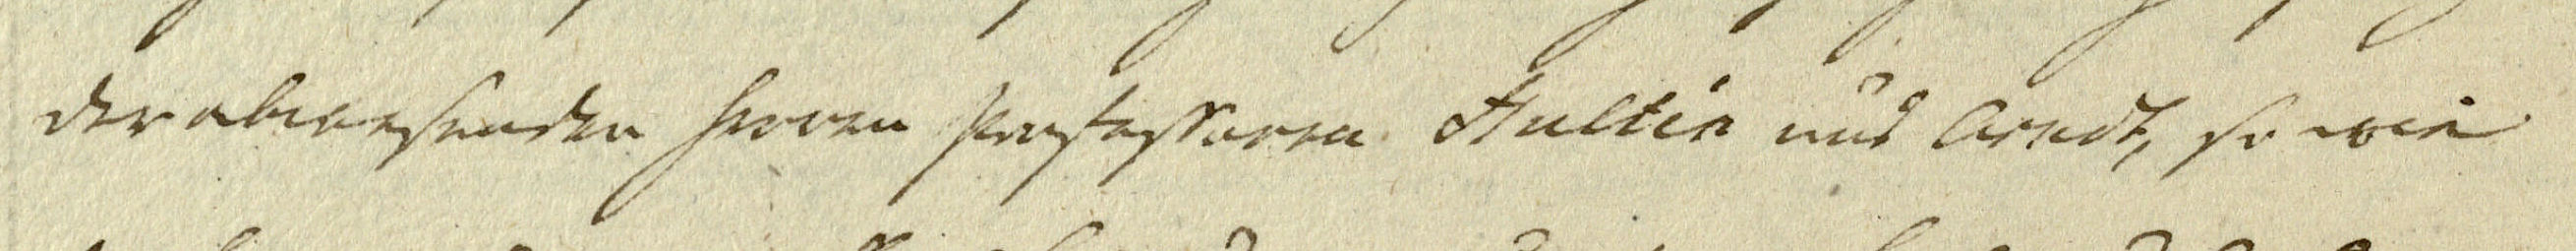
der abwesenden Herren Professoren Hultén und Arndt, so wie
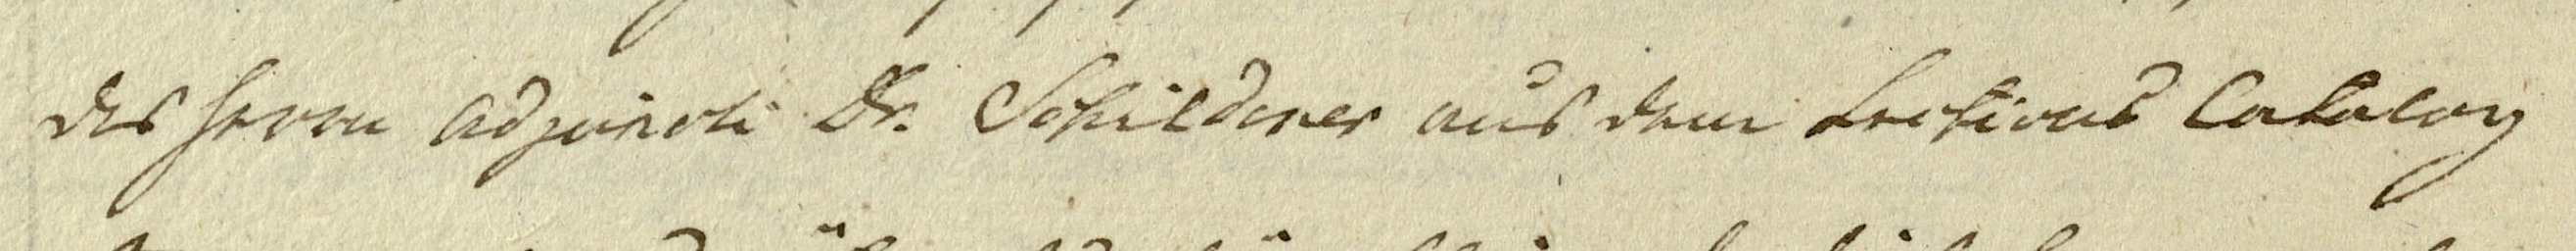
des Herrn Adjuncti Dr. Schildener aus dem Lections Catalog
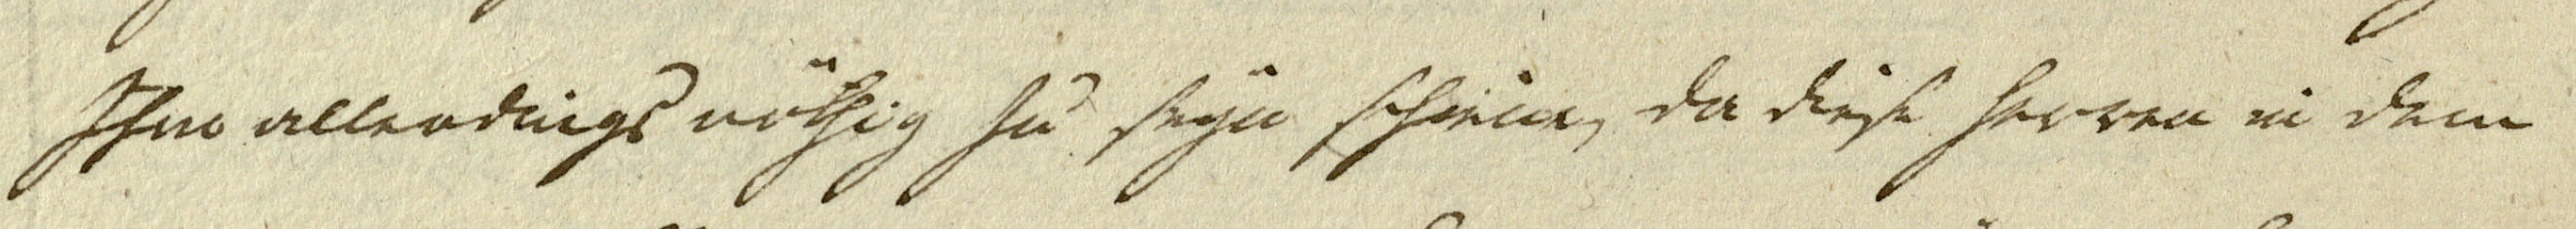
Ihm allerdings nöthig zu seÿn schiene, da diese Herren in dem
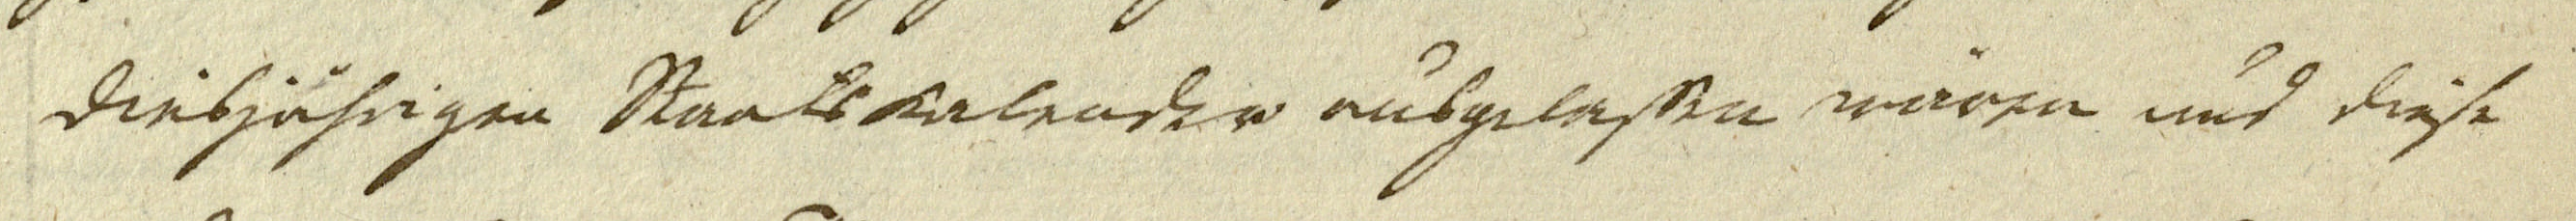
diesjährigen Staatskalender ausgelassen wären und diese
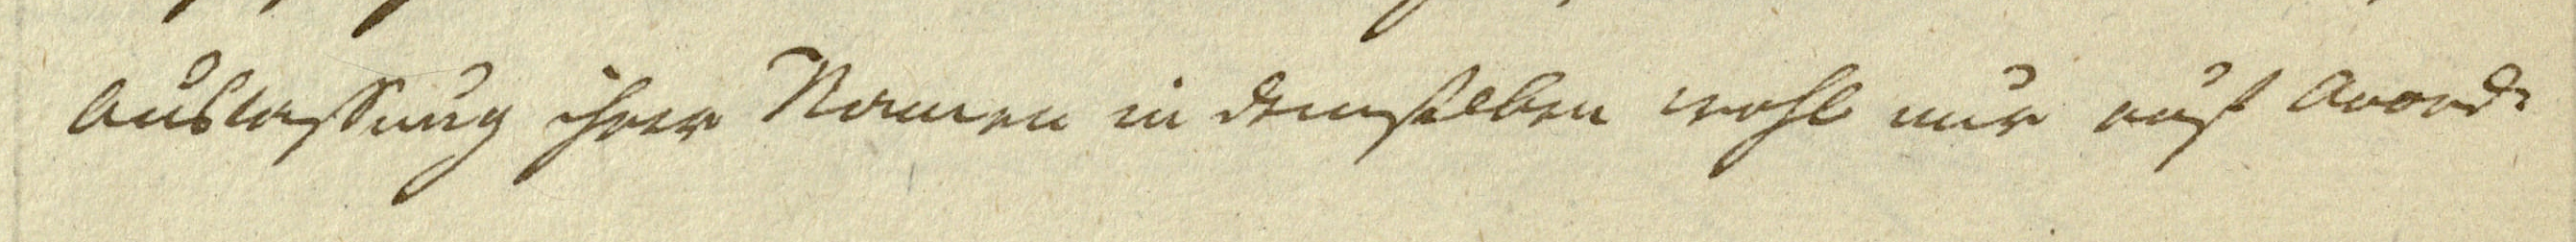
Auslassung ihrer Namen in demselben wohl nur auf Anord¬
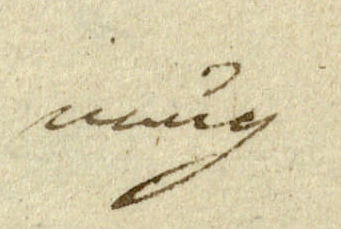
nung
